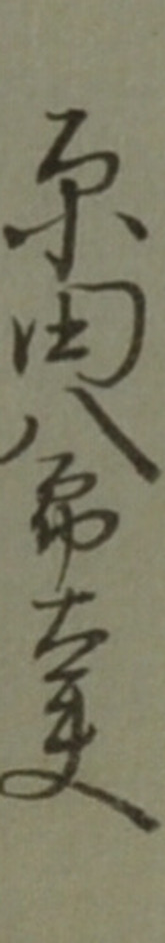原田八郎太夫
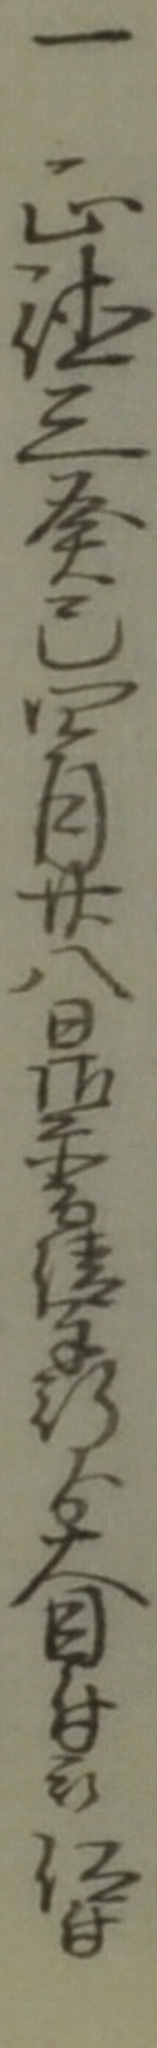一正徳三癸巳四月廿八日御普請奉行ゟ大目付被仰付
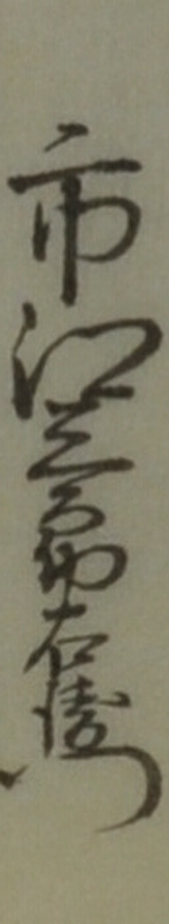市江三郎右衛門
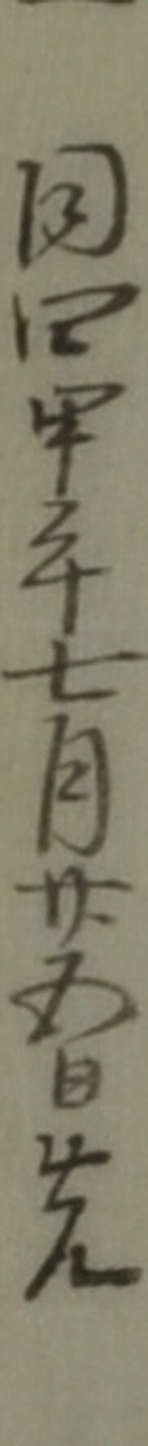一同四甲午七月廿五日先
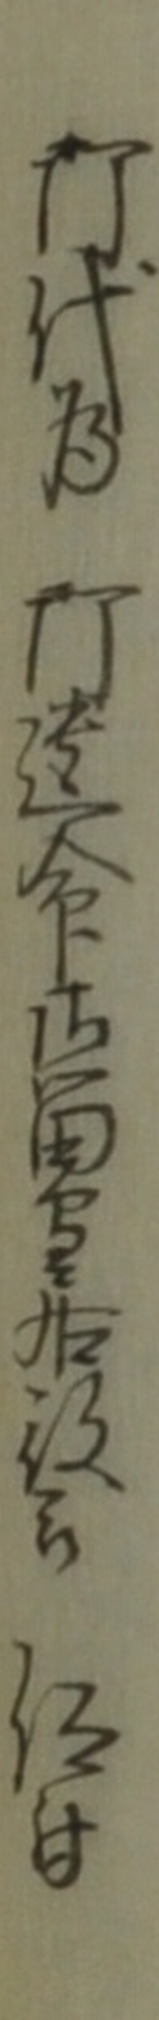御代為御遺命御留守居役被仰付
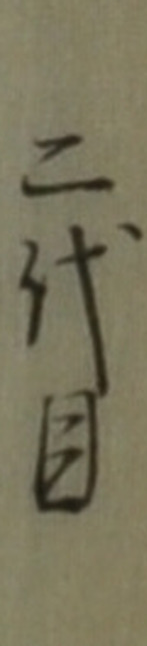二代目
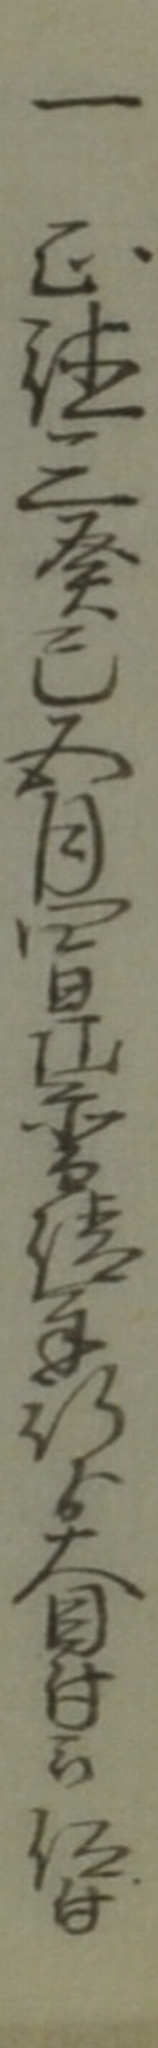一正徳三癸巳五月四日御普請奉行ゟ大目付被仰付
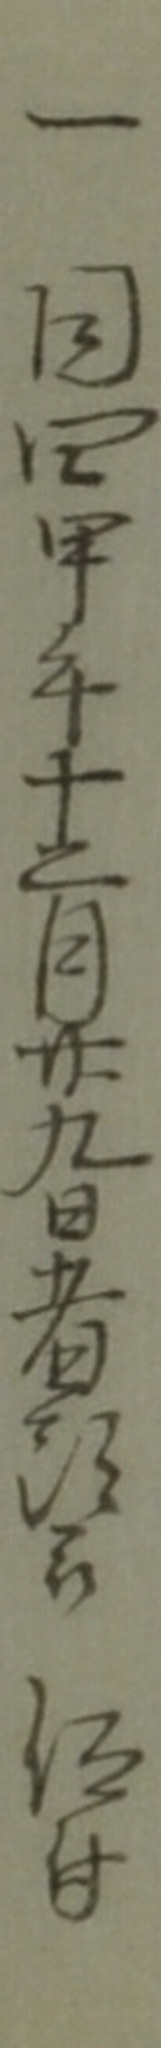一同四甲午十二月廿九日者頭被仰付
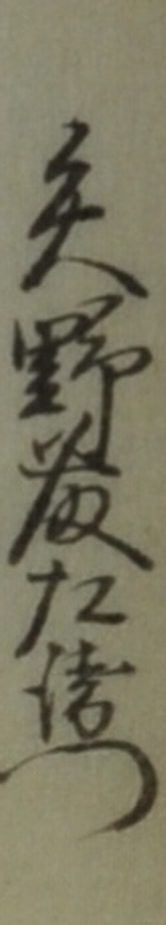矢野藤左衛門
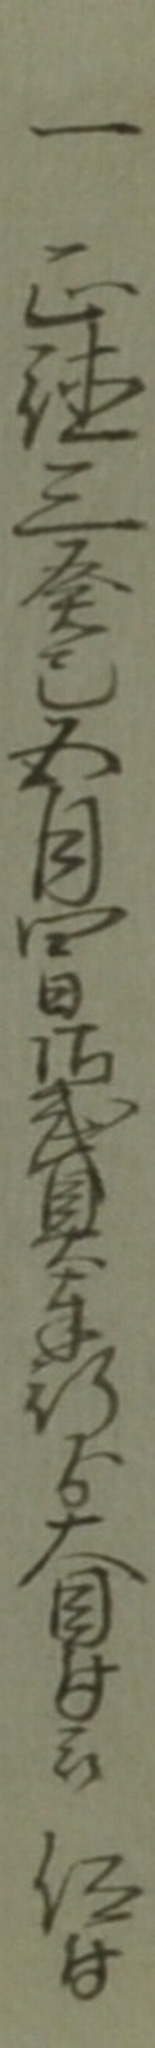一正徳三癸巳五月四日御武具奉行ゟ大目付被仰付
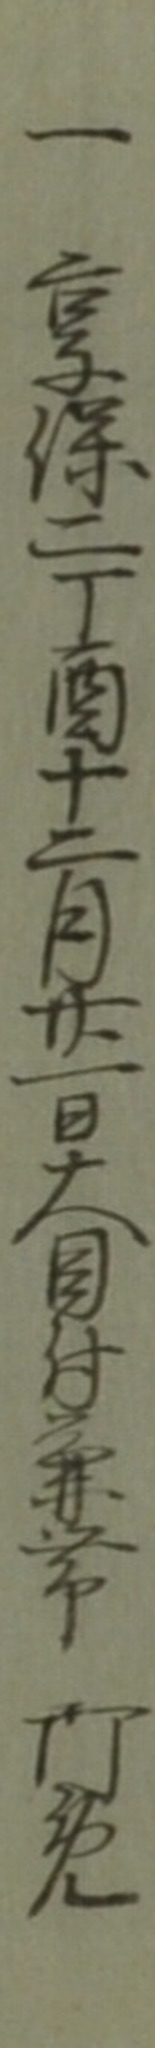一享保ニ丁酉十二月廿一日大目付兼帯御免
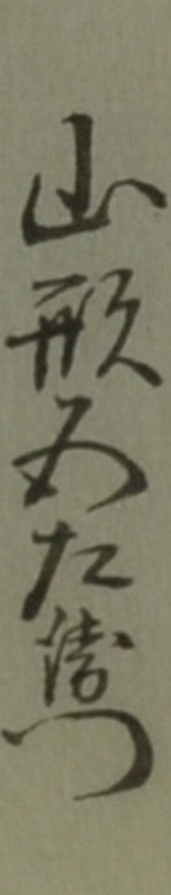山形五左衛門
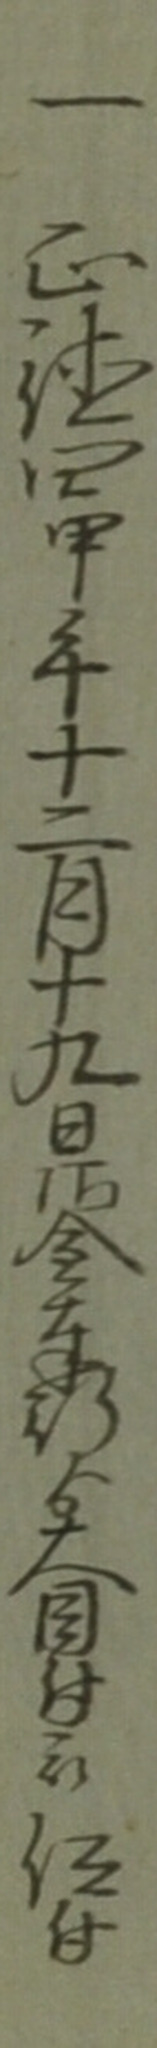一正徳四甲午十二月十九日御金奉行ゟ大目付被仰付
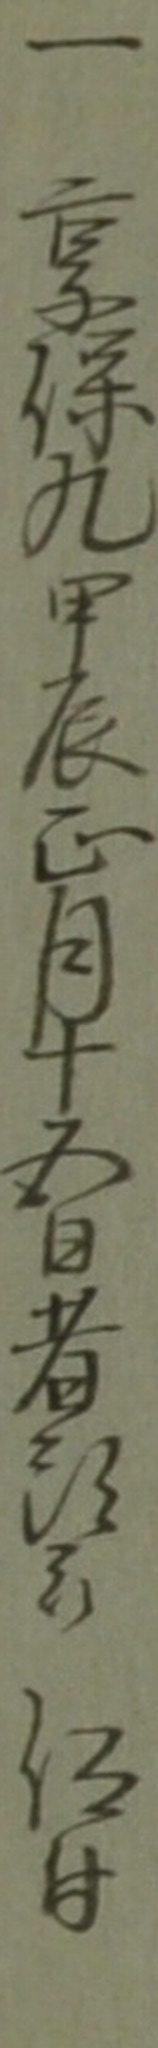一享保九甲辰正月十五日者頭被仰付
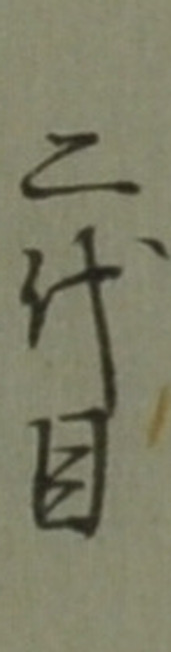二代目
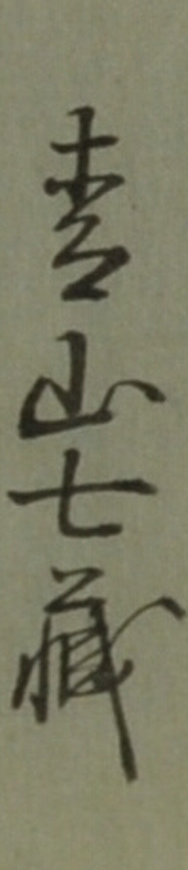青山七蔵
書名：諸御役代々録（三）
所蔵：伊那市立高遠町図書館・合同会社AMANE
